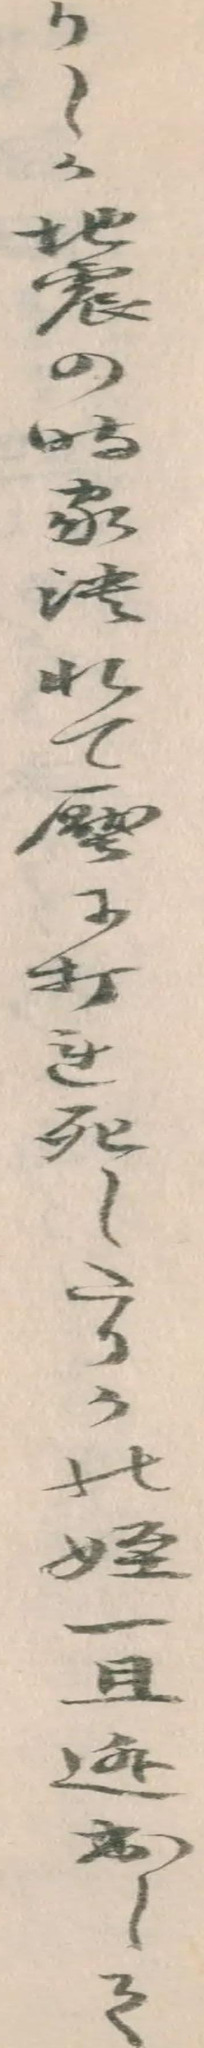りしか地震の時家潰れて圧に打れ死したりかの姪一旦逃出して
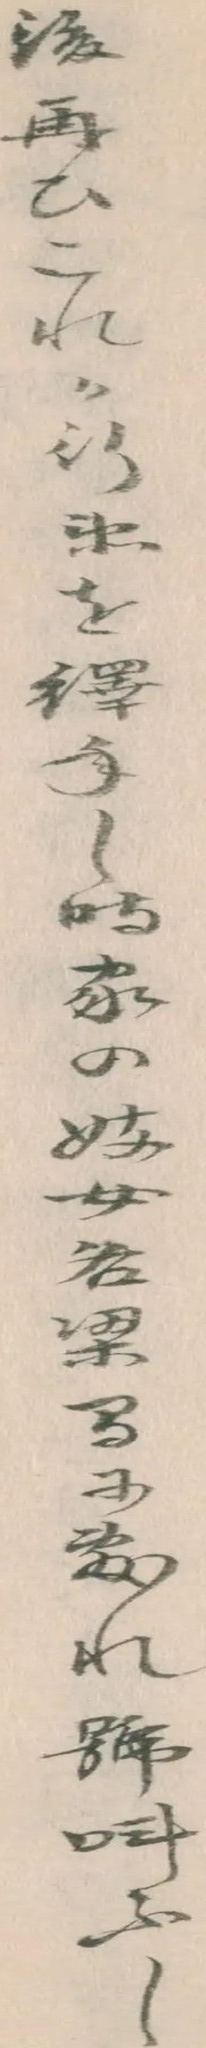後再ひこれか行ゑを繹ねし時家の妓女各梁間に敷れ号叫ふし
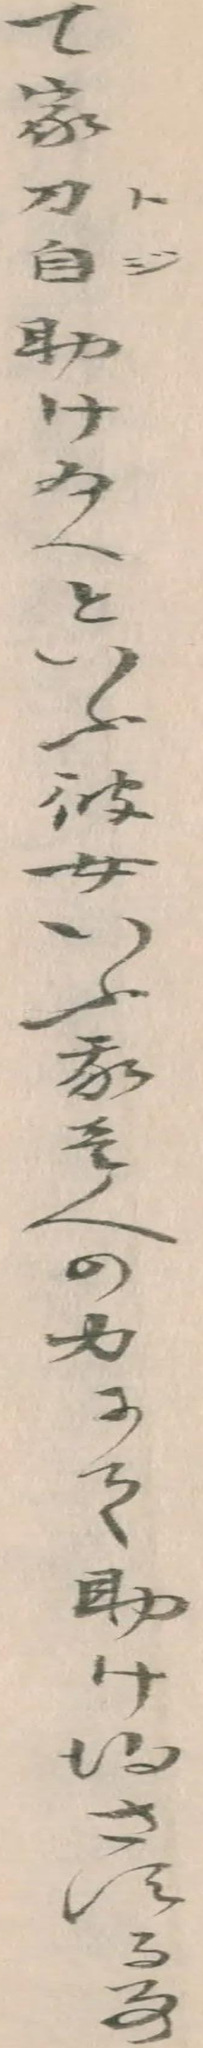て家刀自助け給へといふ彼女いふ我壱人の力にて助け得さする事
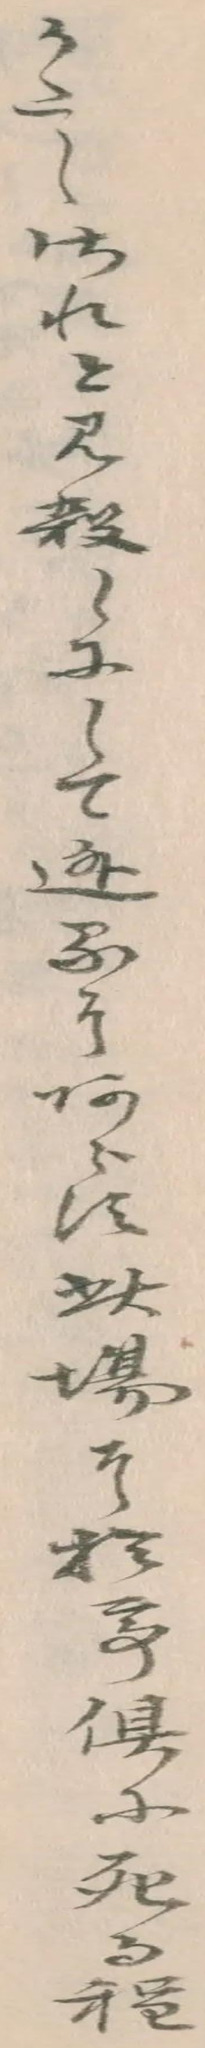かたしされと見殺しにして逃るにあらす此場に於て倶に死る程
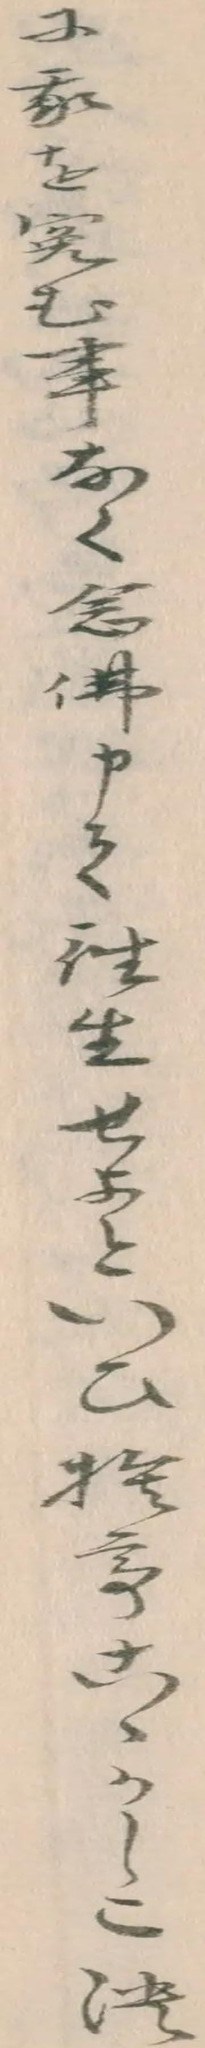に我を冤む事なく念仏申て往生せよといひ捨てこゝかしこ潰
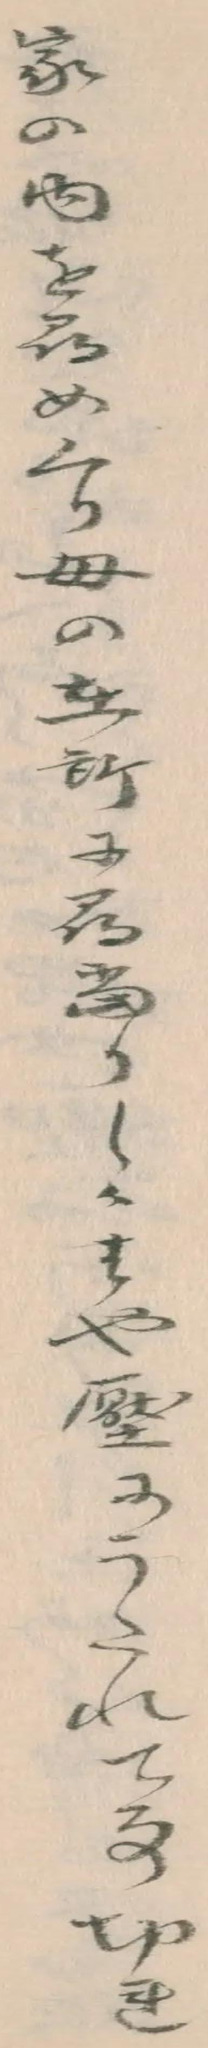家の内を尋めくり母の在所に尋当りしかはや圧にうたれて事切れ
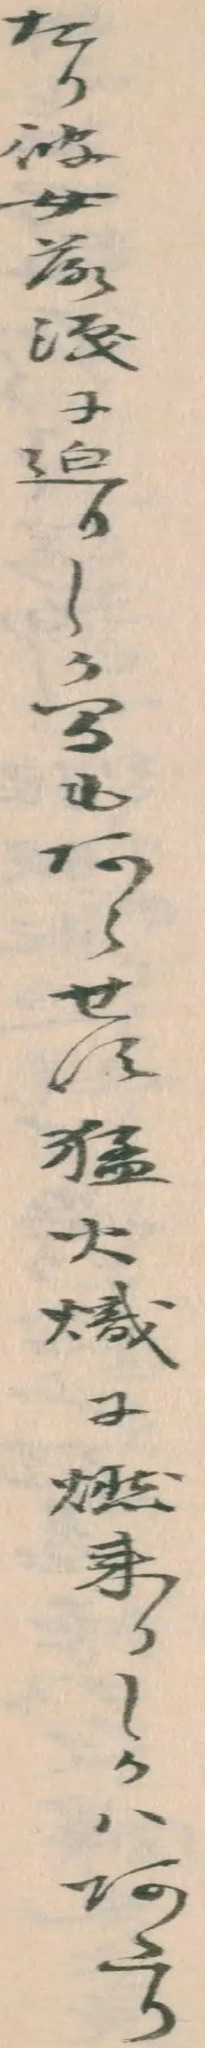たり彼女落涙に迫りしか間もあらせす猛火熾に燃来りしかはあたり
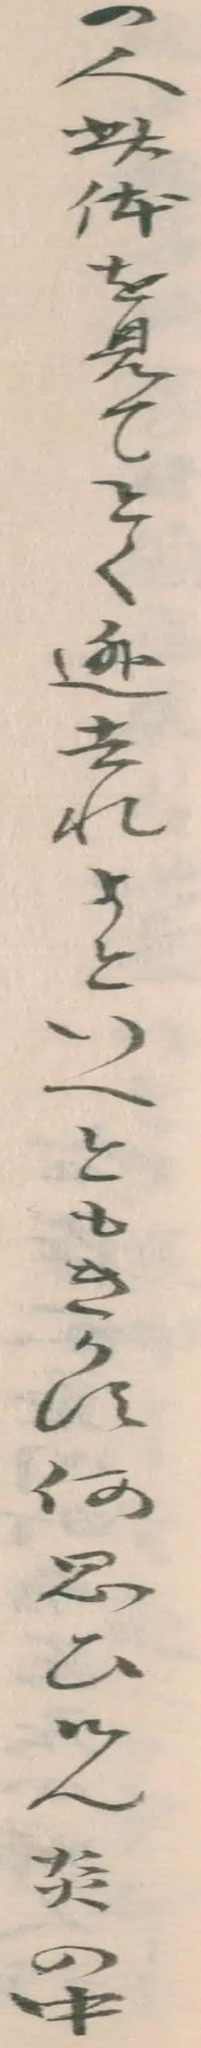の人此体を見てとく逃去れよといへともきかす何思ひけん炎の中
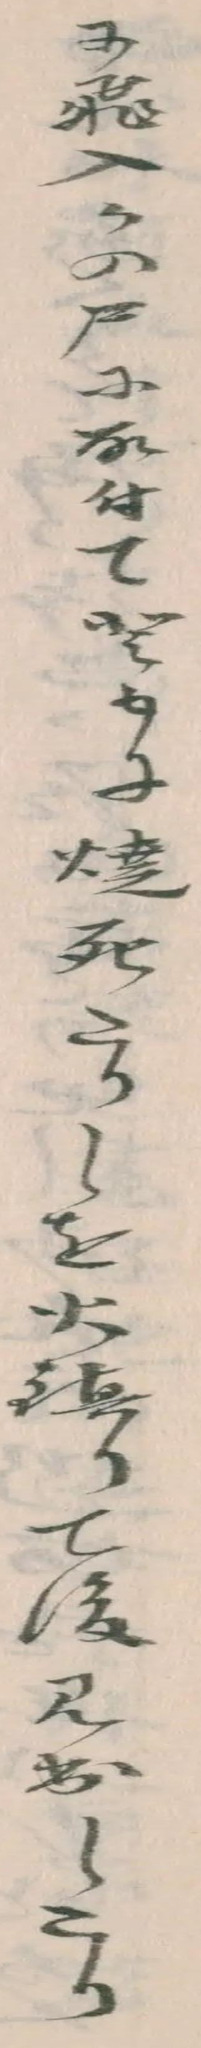に飛入かの屍に取付てともに焼死たりしを火鎮りて後見出したり
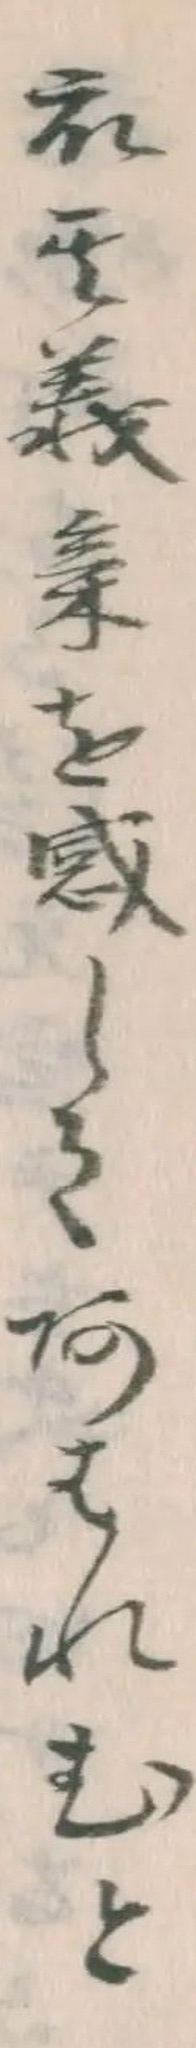衆其義気を感してあはれむと
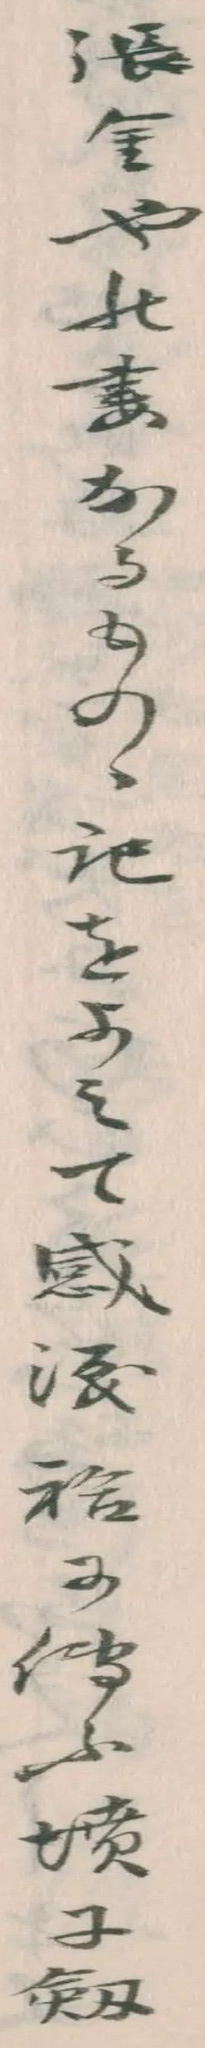張金やの妻なるものゝ記をよみて感涙袷に伝ふ墳に剣
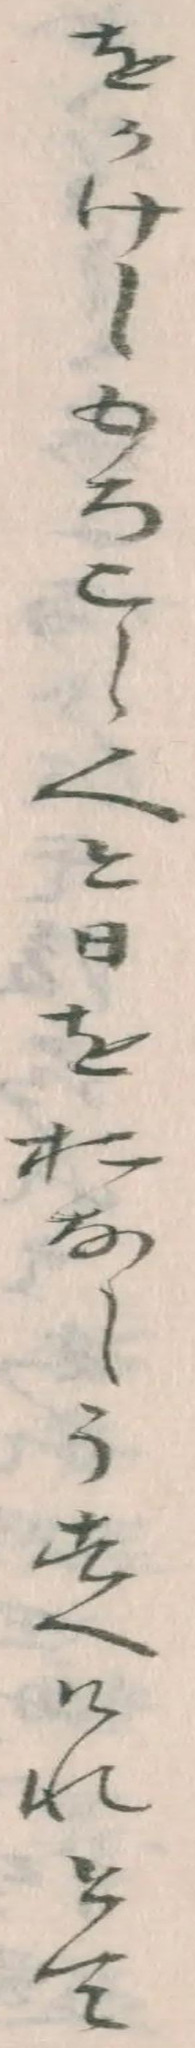をかけしもろこし人と日をおなしうすへけれとて
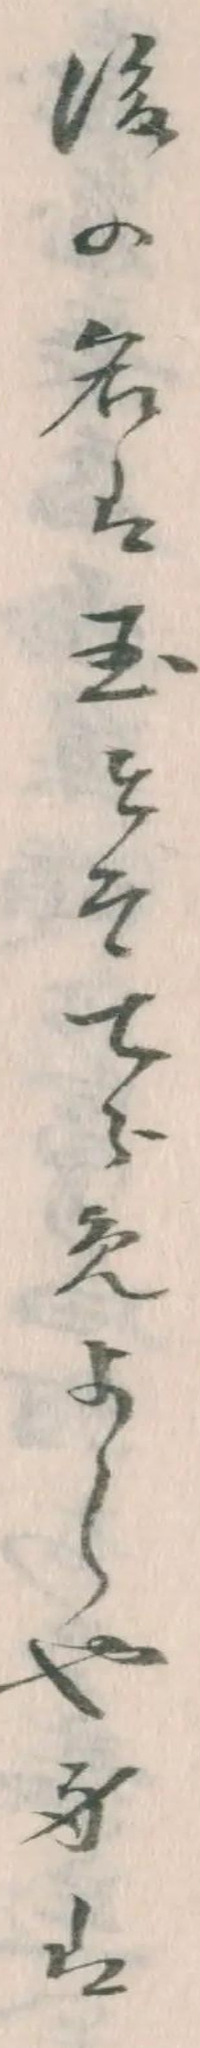後の名は玉とそてらめよしや身は
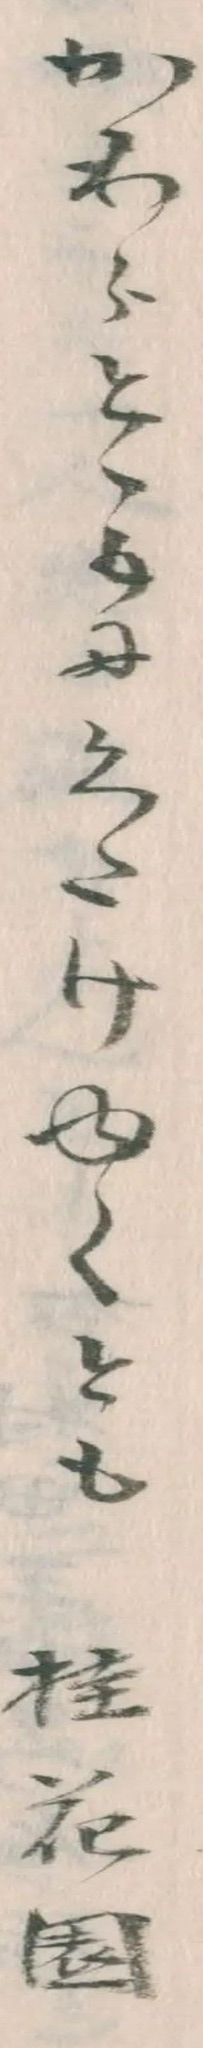かわらとゝもにくたけゆくとも桂花園
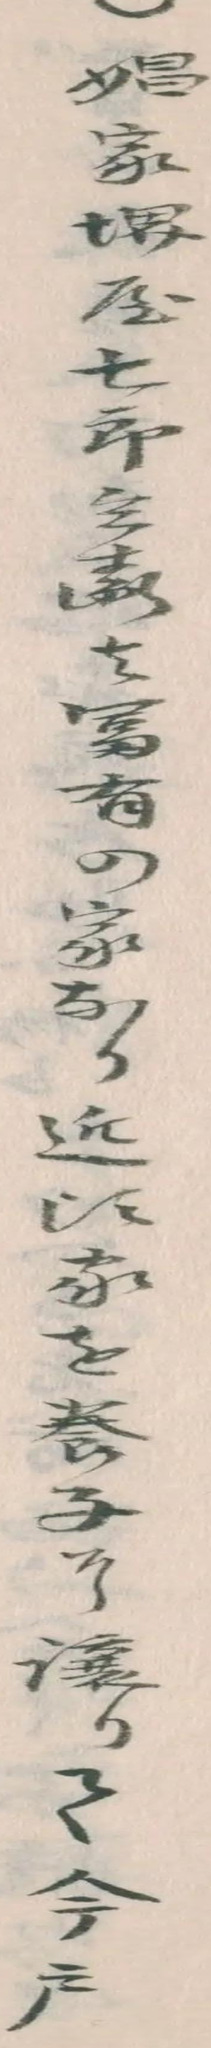〇娼家堺屋七郎兵衛は冨有の家なり近頃家を養子に譲りて今戸
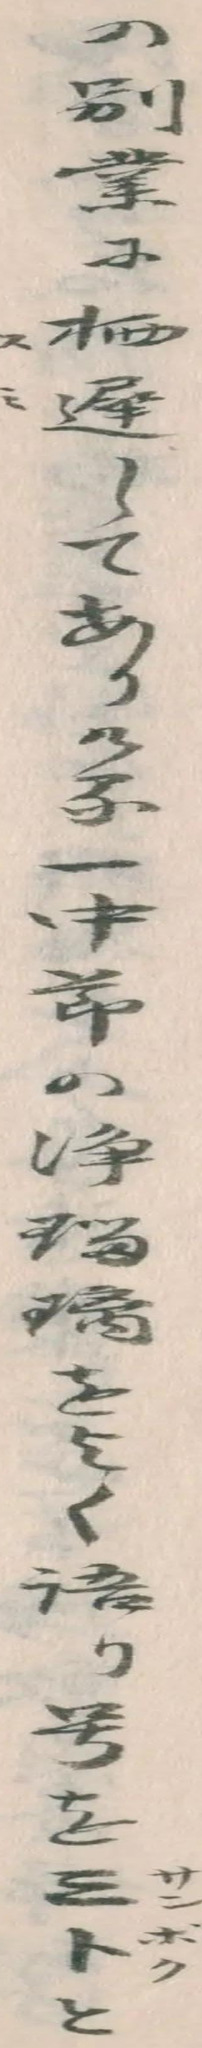の別業に栖遅してありける一中節の浄瑠璃をよく語り号を三卜と
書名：地災撮要. 巻10(地震之部) 上,下
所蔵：国立国会図書館 National Diet Library, JAPAN
